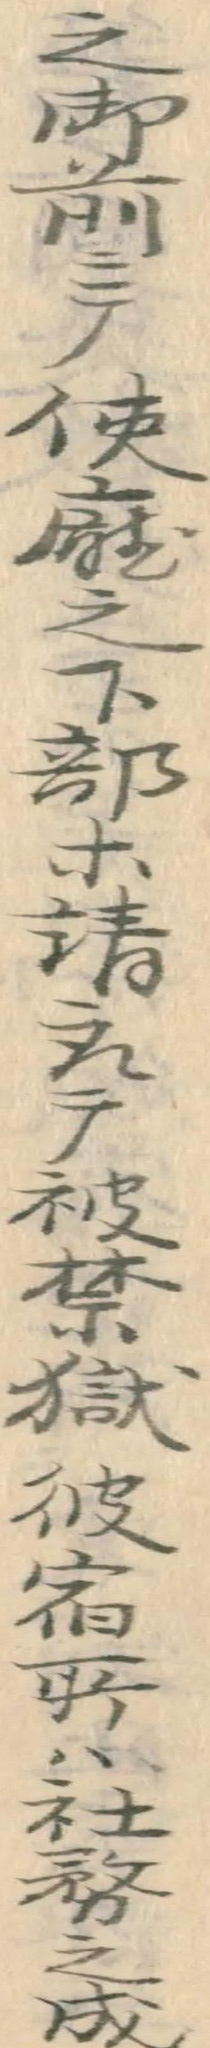之御前ニテ使庁之下部等請取テ被禁獄彼宿所ハ社務之成
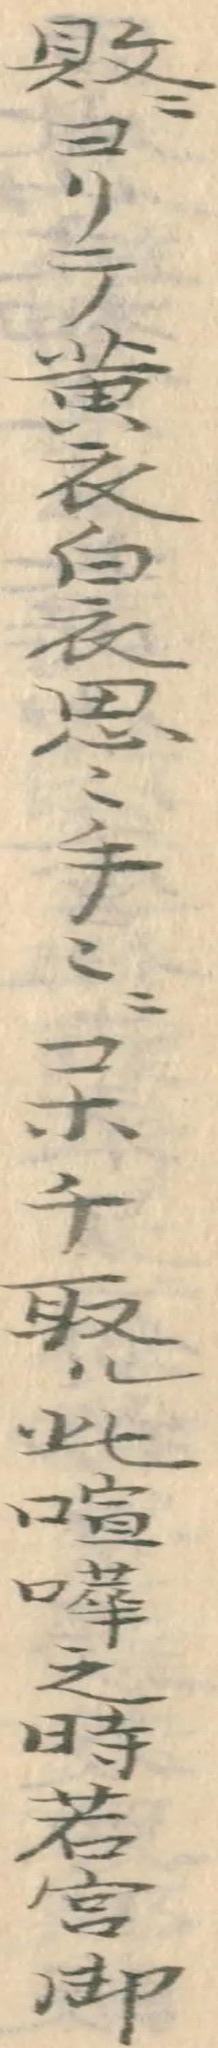敗ニヨリテ黄衣白衣思々手々ニコホチ取ル此喧嘩之時若宮御
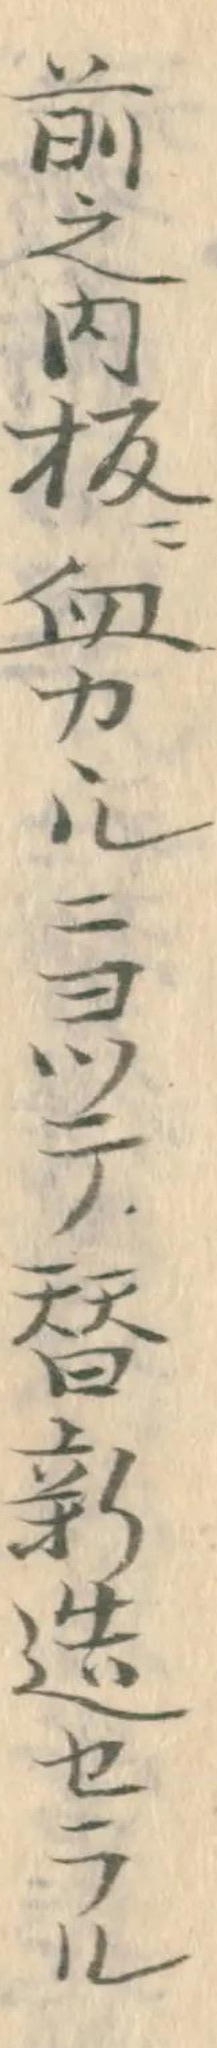前之内板ニ血カヽルニヨツテ替新造セラル
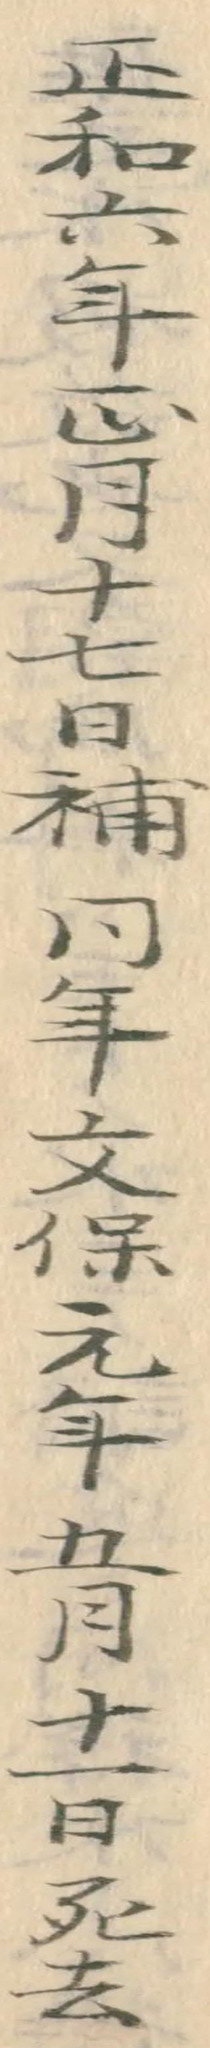正和六年正月十七日補同年文保元年五月十一日死去
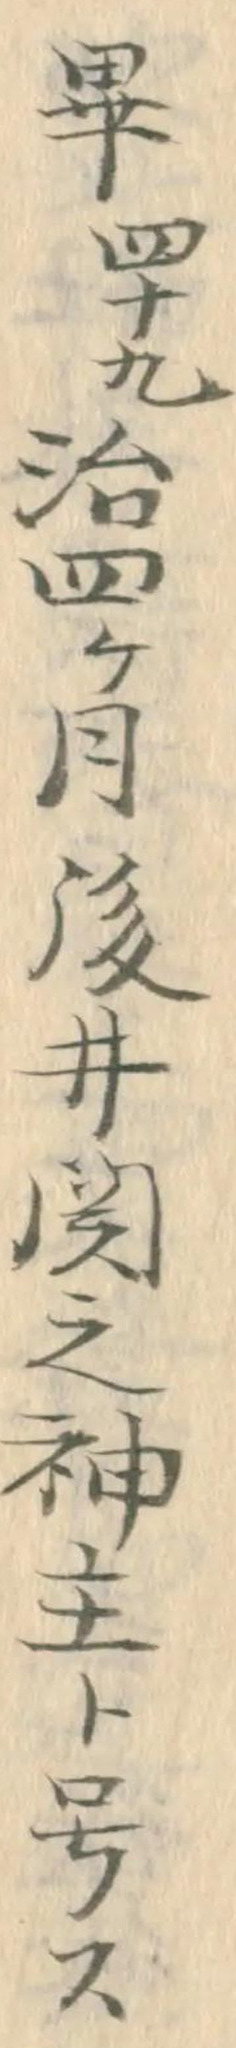畢四十九治四ケ月後井関之神主ト号ス
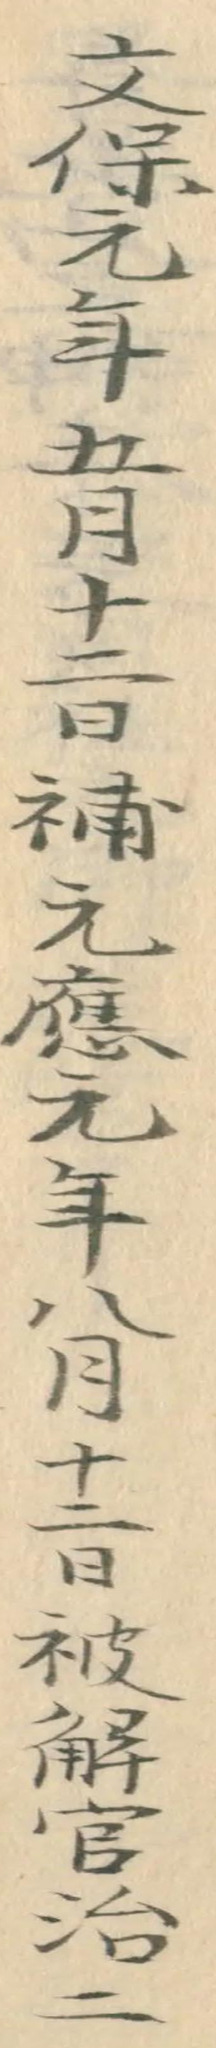文保元年五月十二日補元応元年八月十二日被解官治二

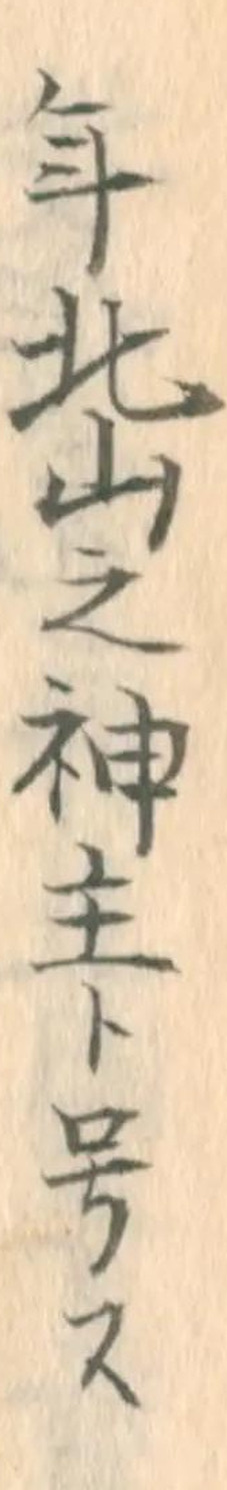年北山之神主ト号ス
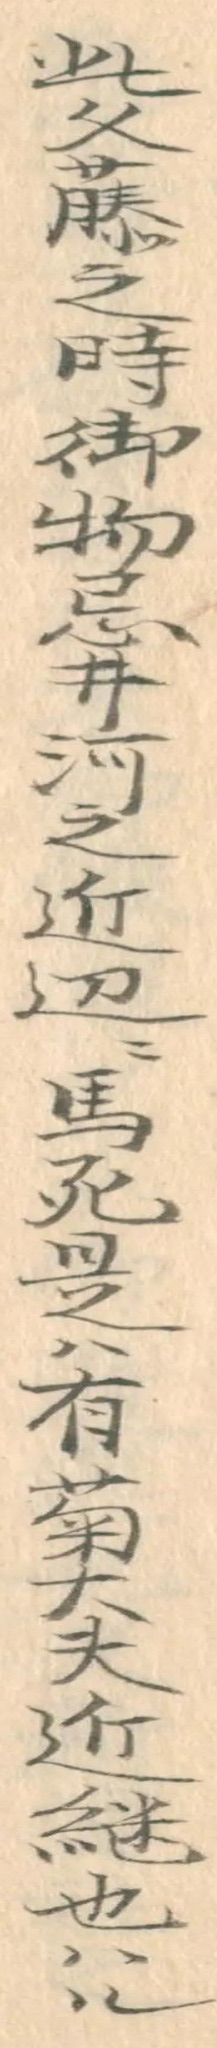此久藤之時御物忌井河之近辺ニ馬死是ハ有菊大夫近継也ハル
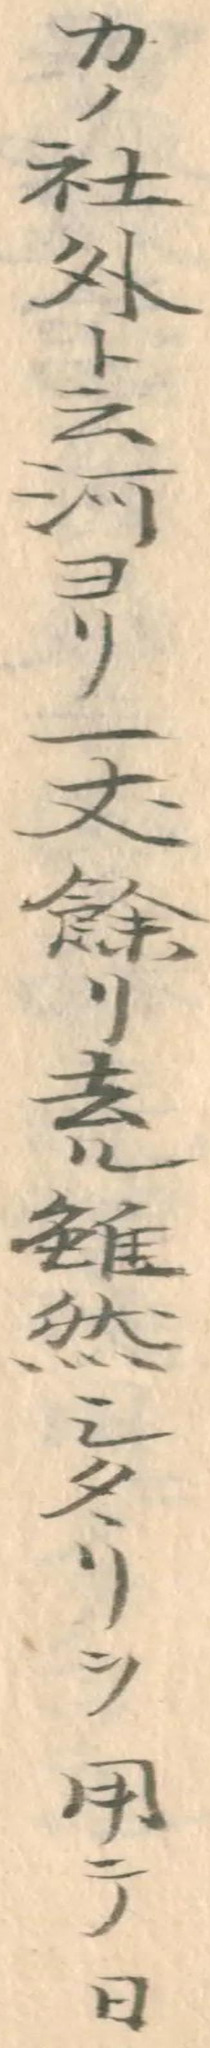カノ社外ト云河ヨリ一丈余リ去ル雖然シタヽリヲ用テ日
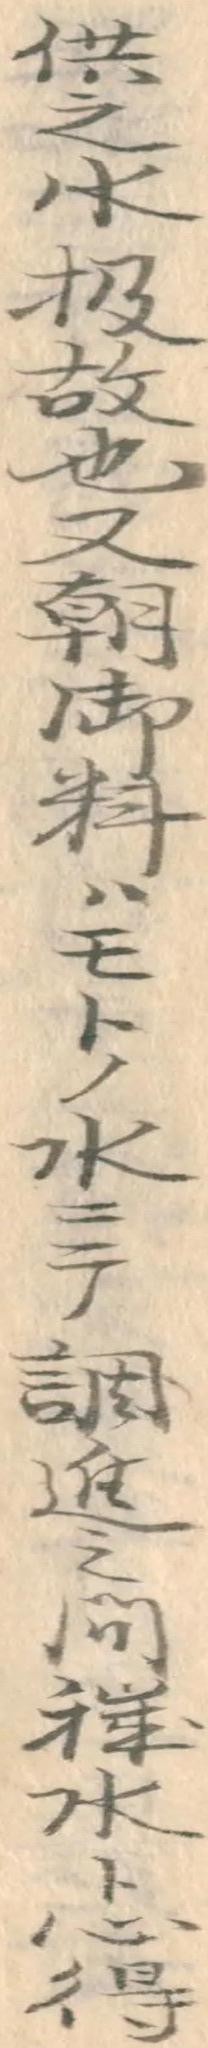供之水扱故也又朝御料ハモトノ水ニテ調進之間穢水ト心得
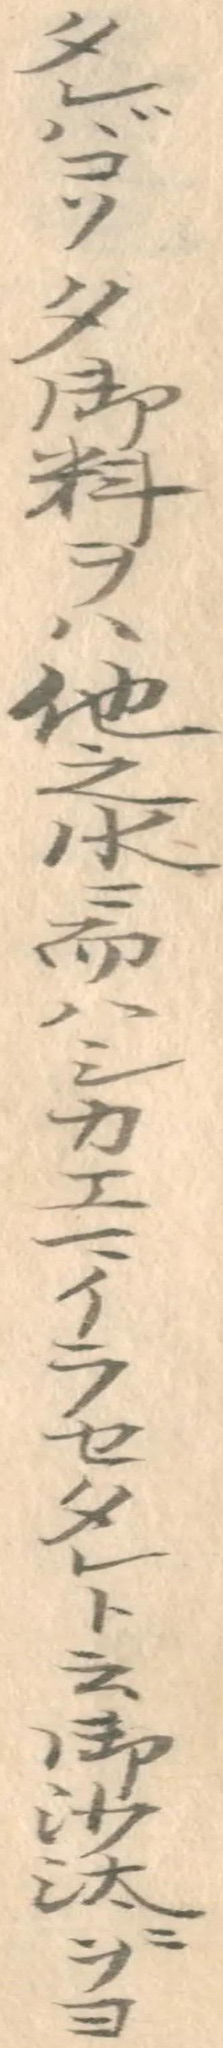タレバコソ夕御料ヲハ他之水ニ而ハシカエマイラセタレト云御沙汰ニヲヨ
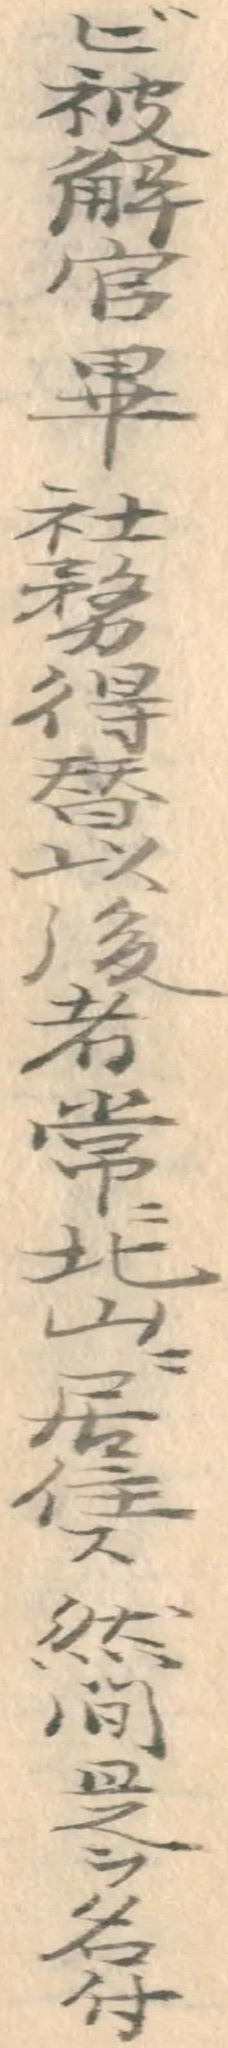ビ被解官畢社務得替以後者常ニ北山ニ居住ス然間是ヲ名付
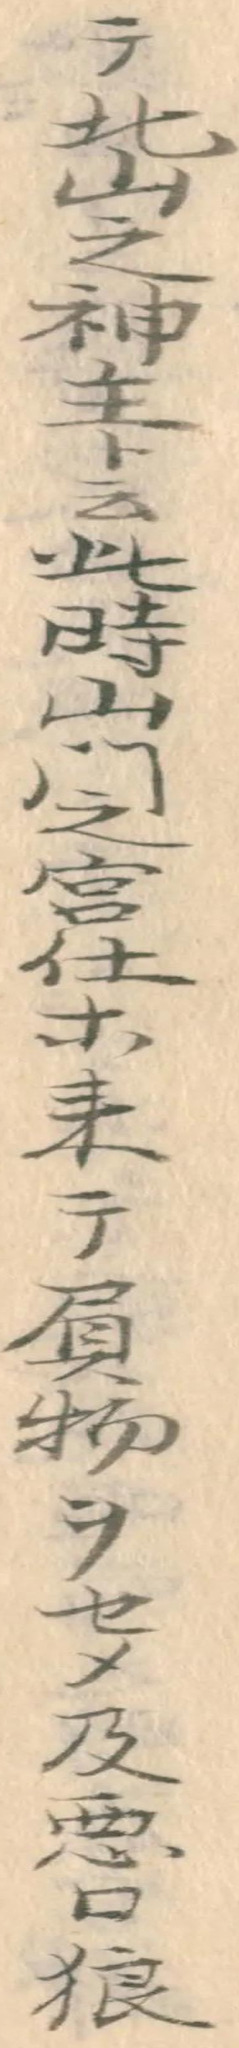テ北山之神主ト云此時山門之宮仕等来テ負物ヲセメ及悪口狼
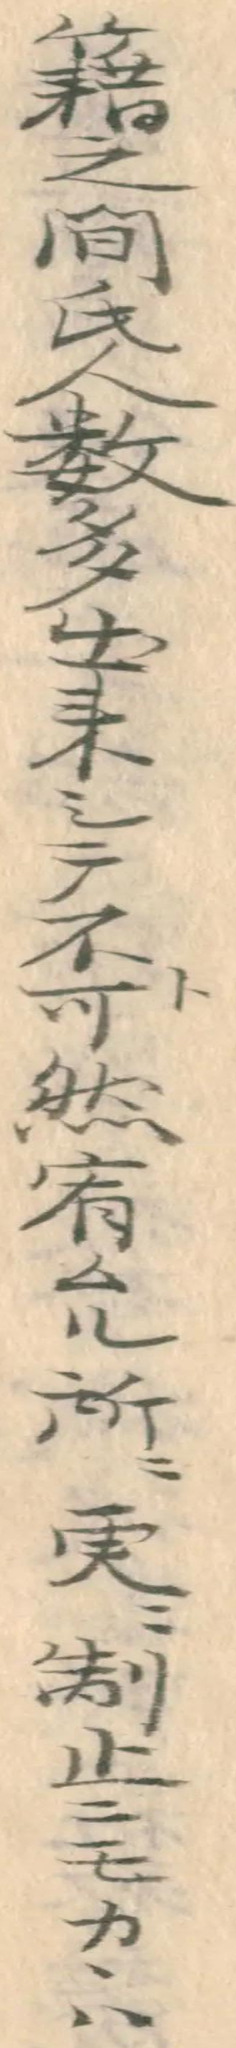籍之間氏人数多出来シテ不可然宥ムル所ニ更ニ制止ニモカヽハ
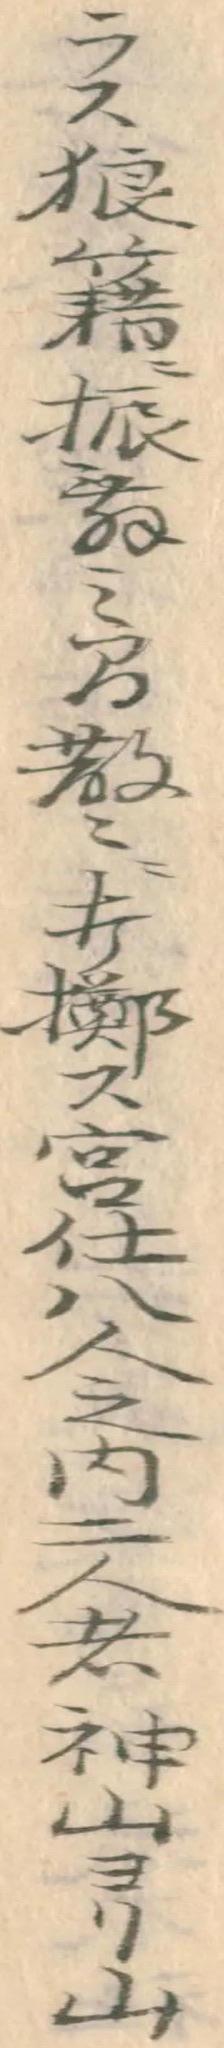ラス狼藉ニ振舞之間散々ニ打擲ス宮仕八人之内二人者神山ヨリ山
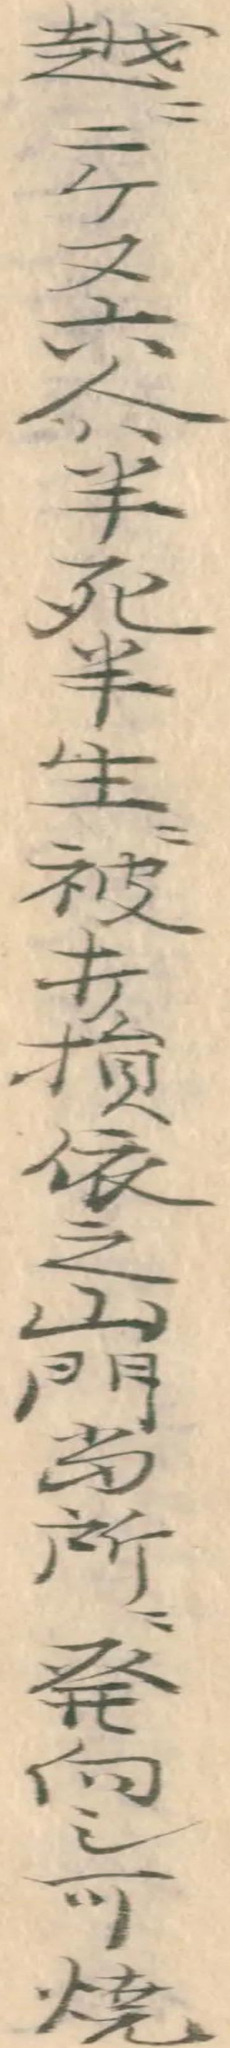越ニニケヌ六人ハ半死半生ニ被打損依之山門当所ニ発向シ可焼
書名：賀茂社記録. 第24冊
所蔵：国立国会図書館 National Diet Library, JAPAN
